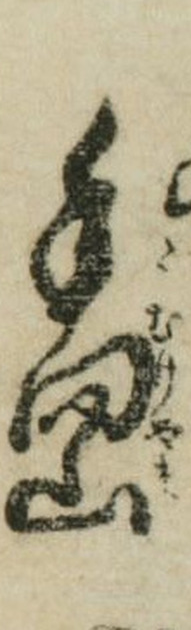手向山
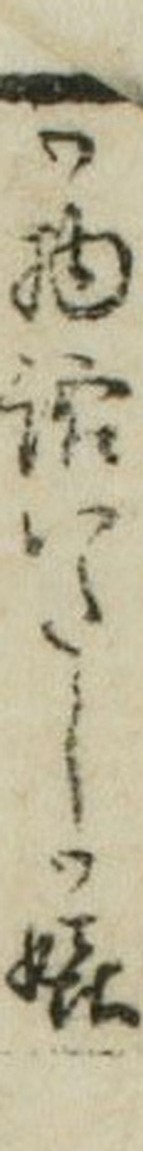御物語いたし御嬉
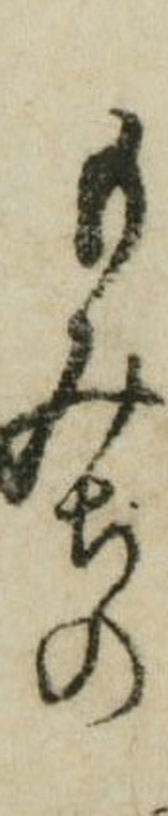もみぢの
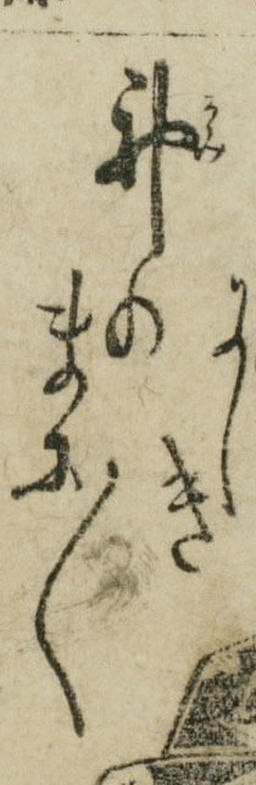まに〳〵
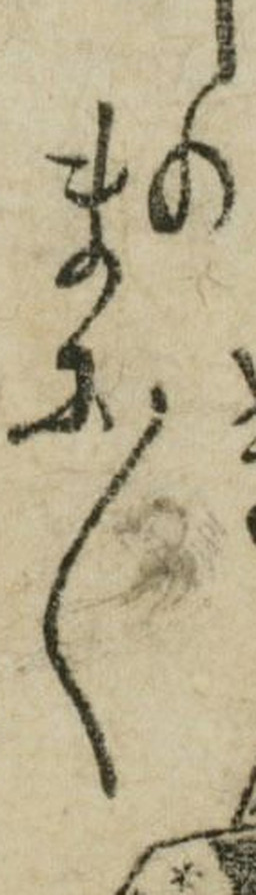まに〳〵
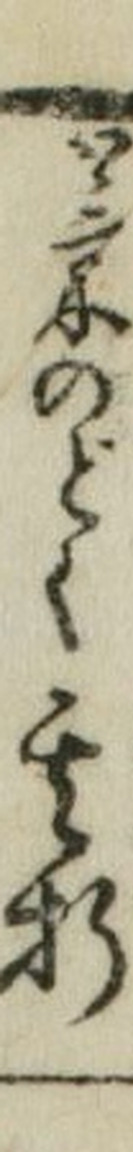御気のどく其折
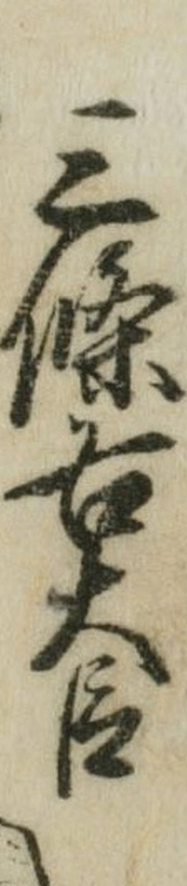三条右大臣
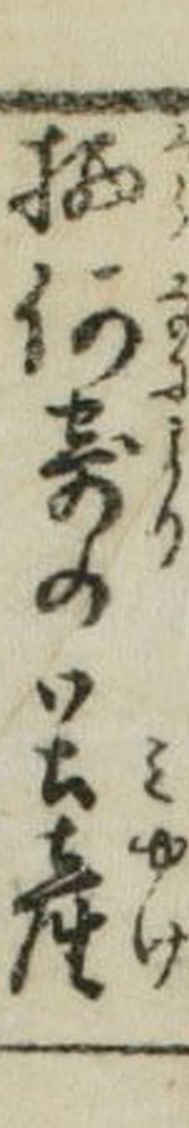柄何寄の御土産
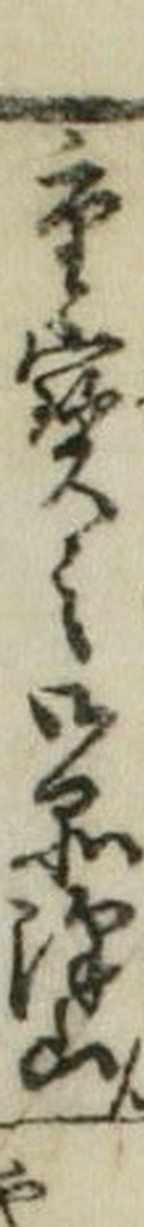重宝之御品沢山
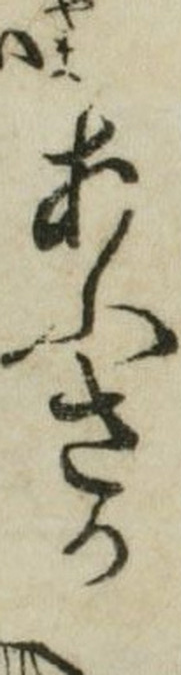あふさか
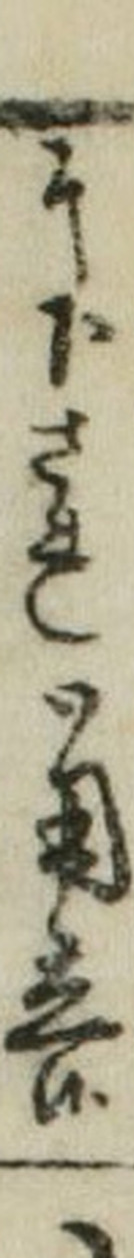に下され御用立候
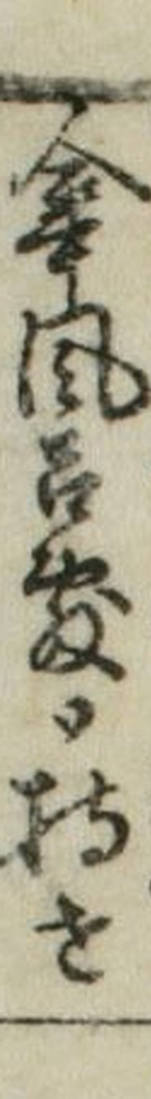傘風呂敷御持せ
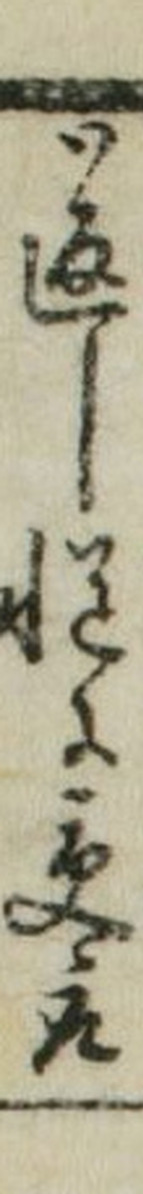御返し慥に受取
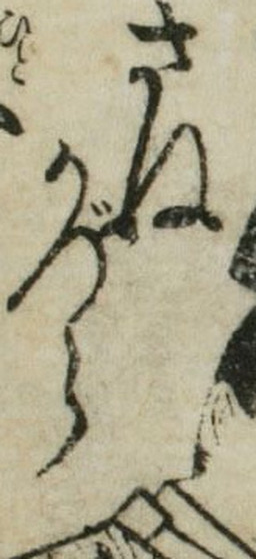かづら
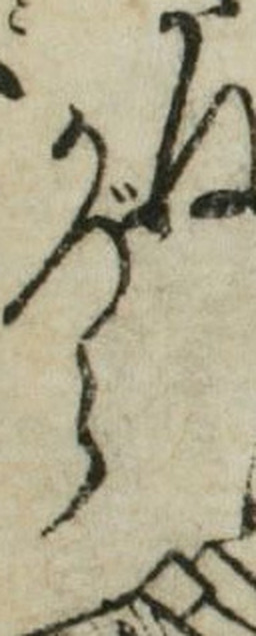かづら
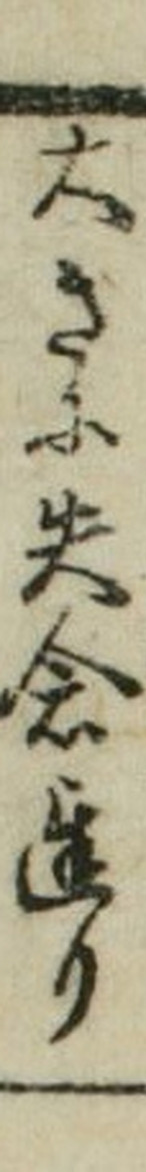大きに失念遅り
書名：百人一首
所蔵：東京学芸大学教育コンテンツアーカイブ
